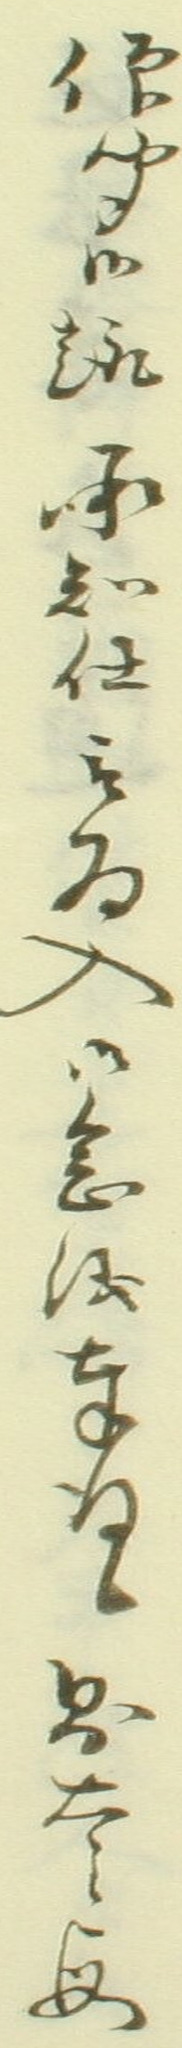仰聞候趣承知仕被為入御念儀奉存候則右之段
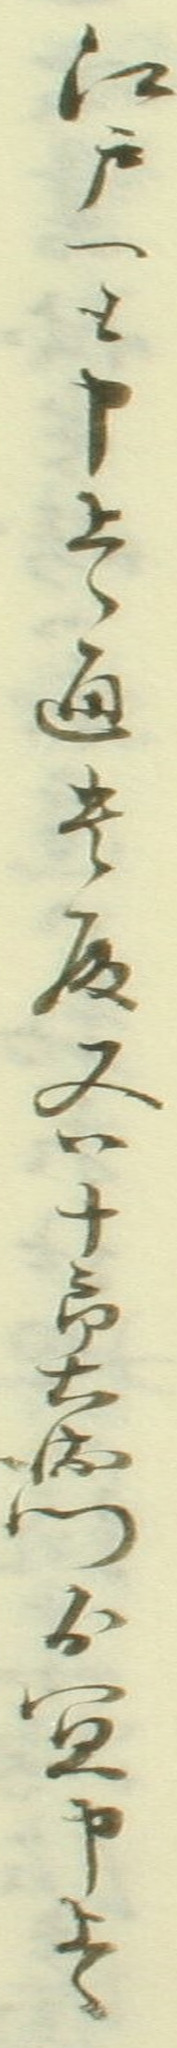江戸へも申上候通貴殿又は十郎右衛門ゟ宜申上候
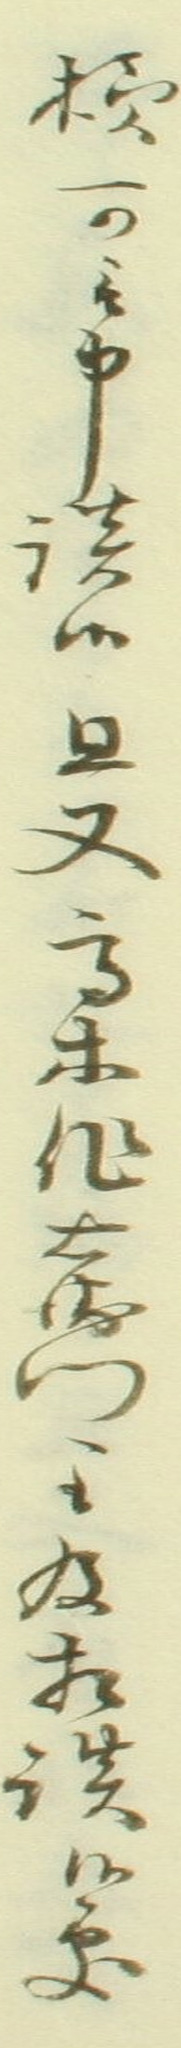様可被申談候且又高木作右衛門へも及相談候処
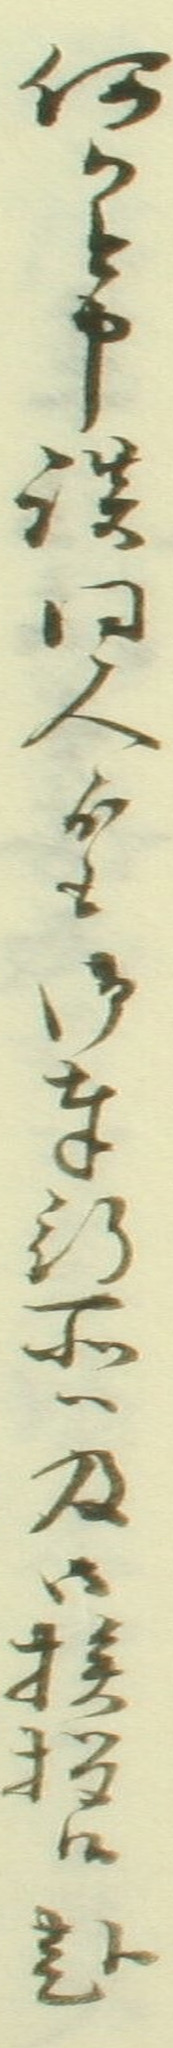何かと申談同人ゟも御奉行所へ及御挨拶候趣
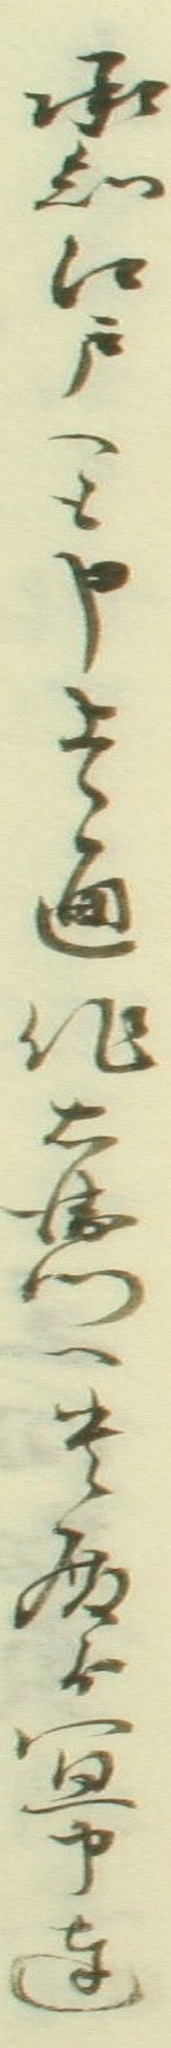承知江戸へも申上候通作右衛門へ貴殿ゟ宜申達
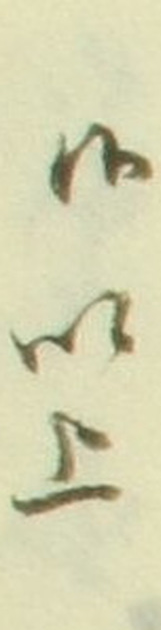候以上

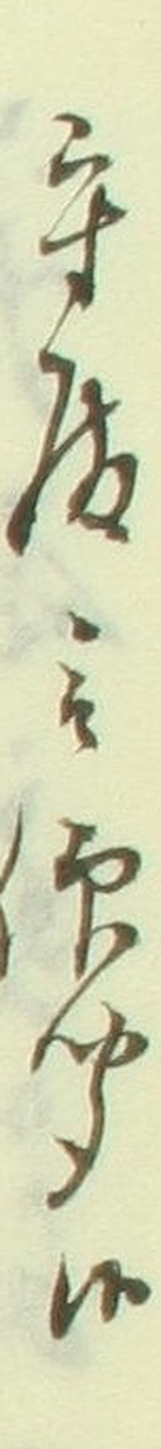守殿被仰聞候
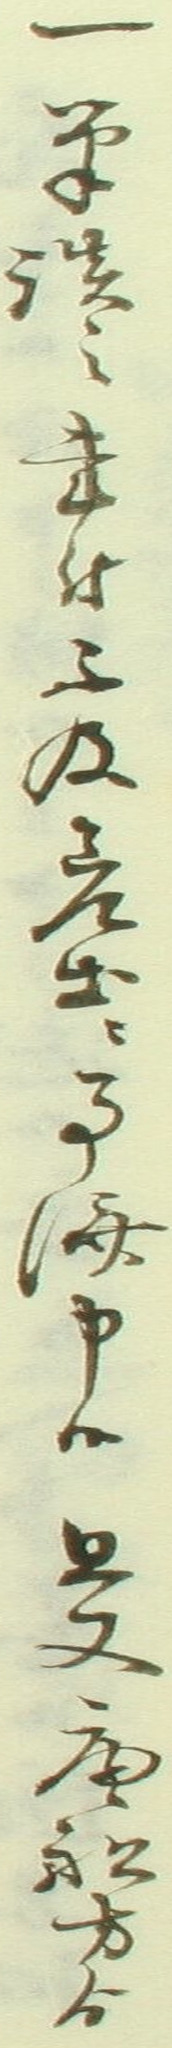一筆談之書付不及差出に事済申候且又唐船方ゟ
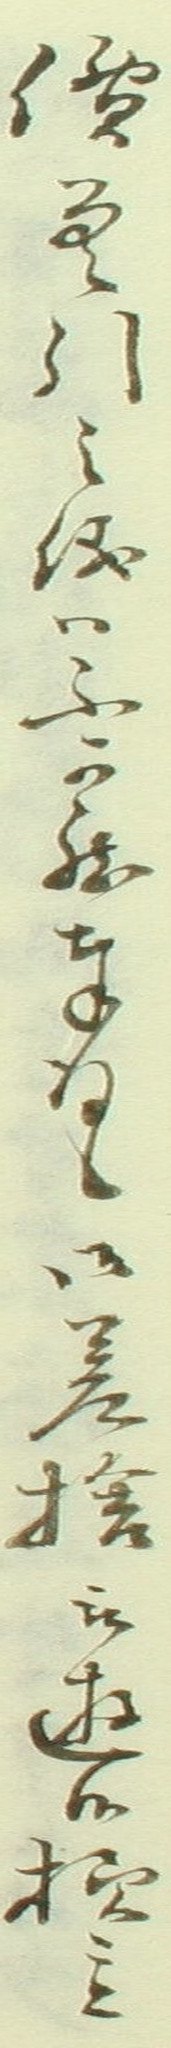価差引之儀は不可然奉存候御差捨被遊候様にと
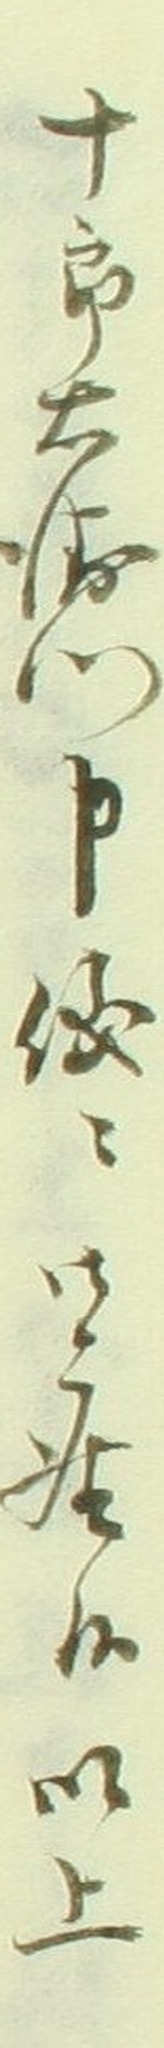十郎右衛門申儀に御座候以上
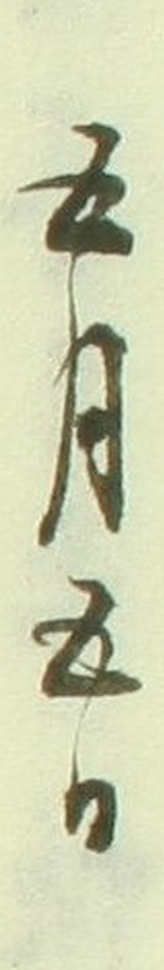五月五日
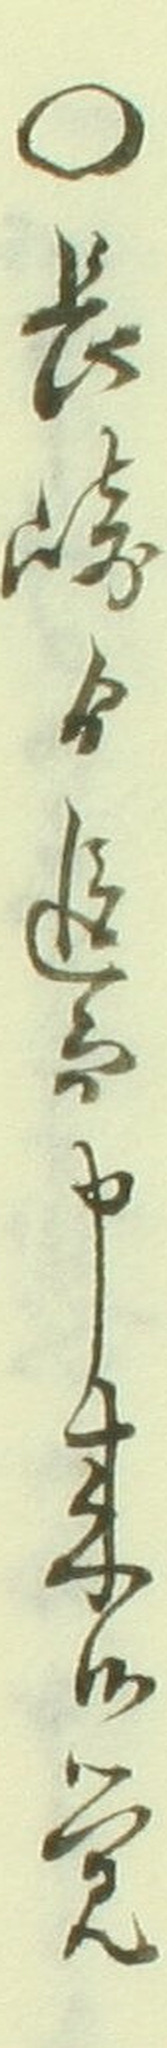〇長崎ゟ追而申来候覚
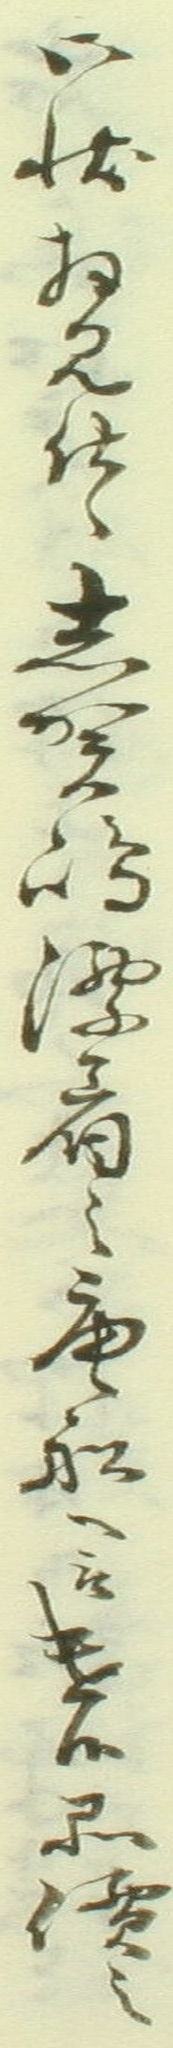御状拝見仕候志賀島漂着之唐船へ被遣候品価之
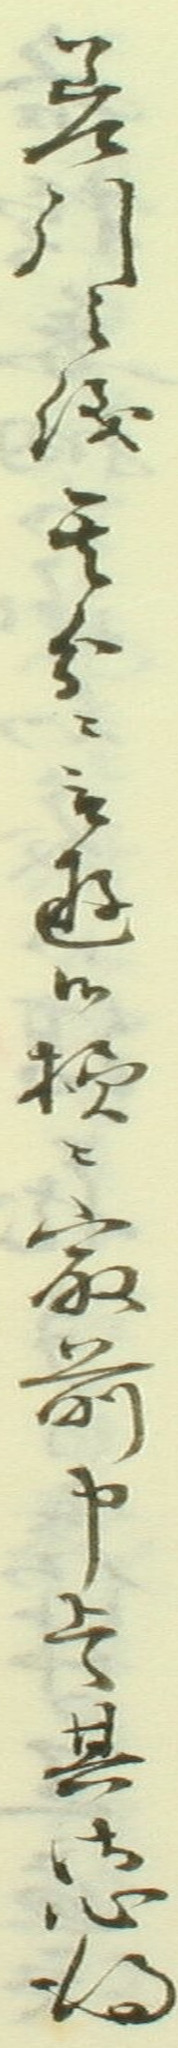差引之儀其分に被遊候様に最前申上候其御心得
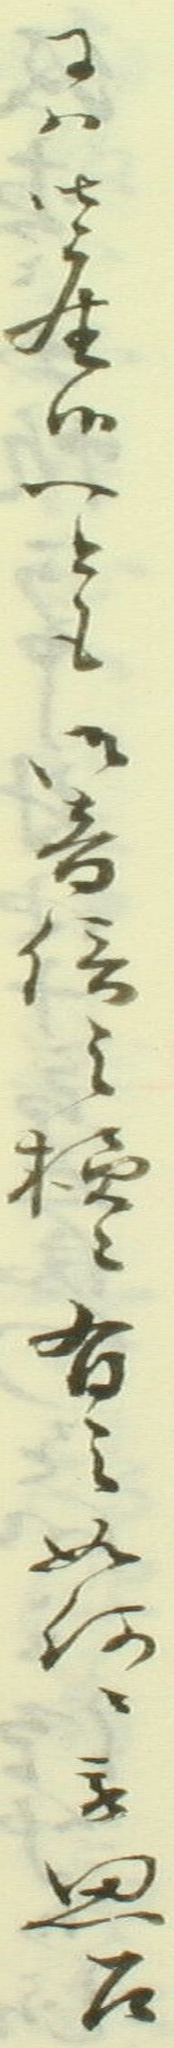には御座候へとも御音信之様に有之如何に被思召
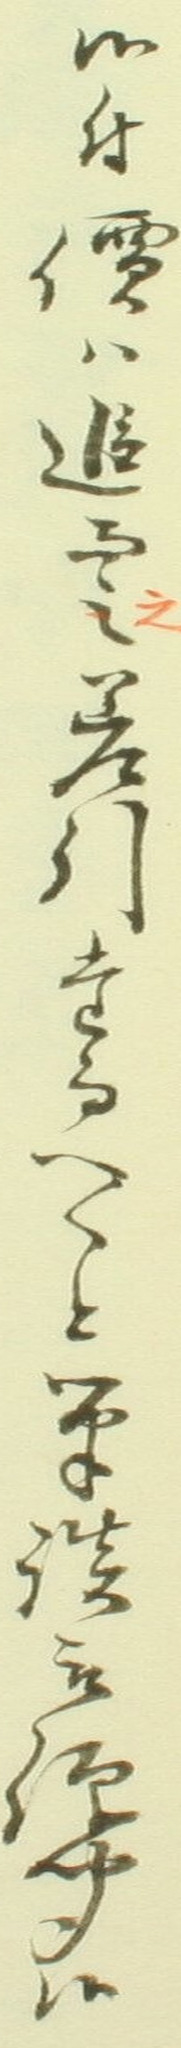候付価は追而之差引たるへくと筆談被仰聞候
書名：異国船漂着記
